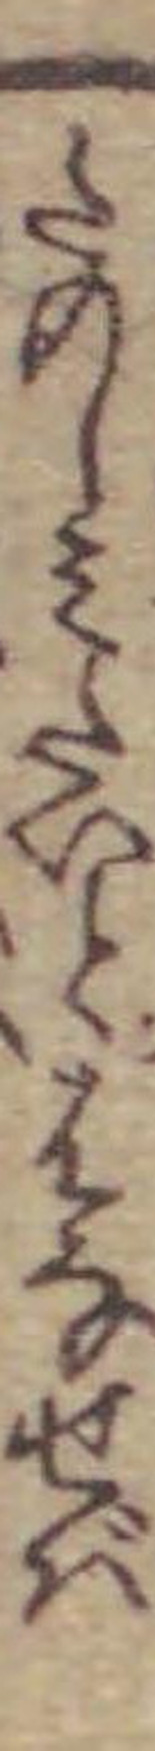たのしみたいとはなせば
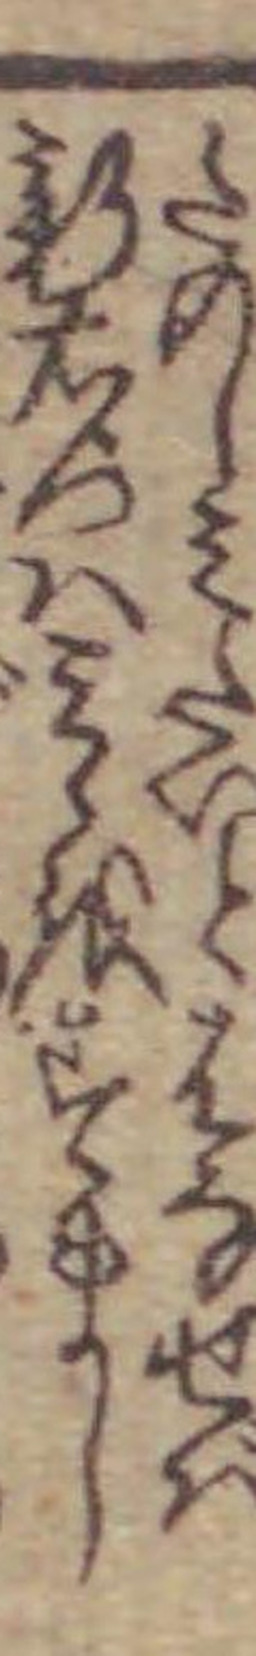新右衛門はみゝをすまし
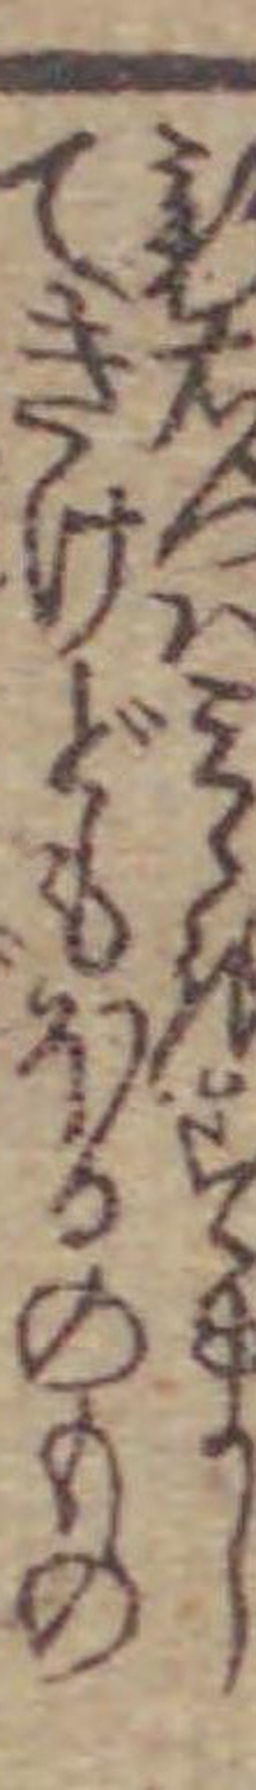てきけどもほかのもの
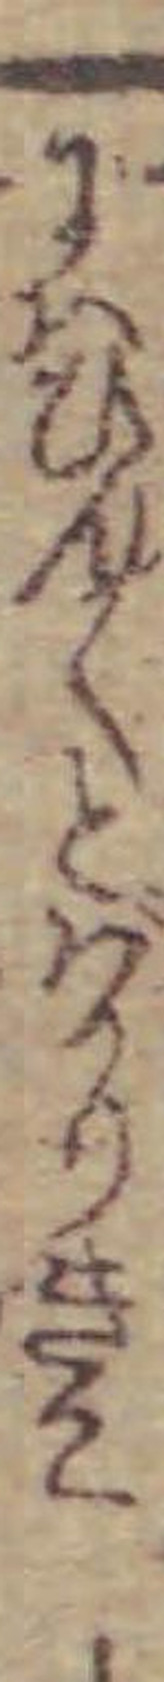にはひん〳〵とばかりきこ
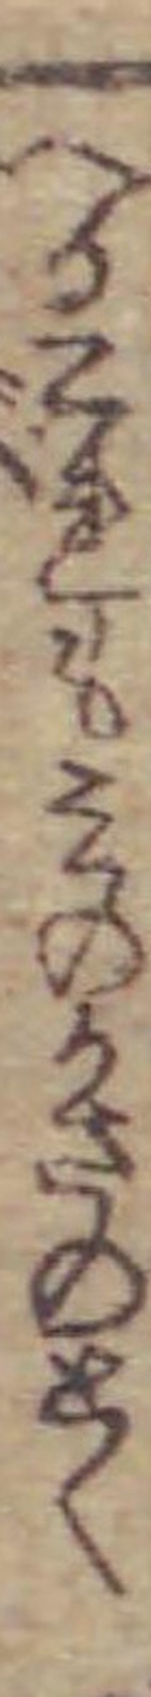へるこれもみのかさのとく
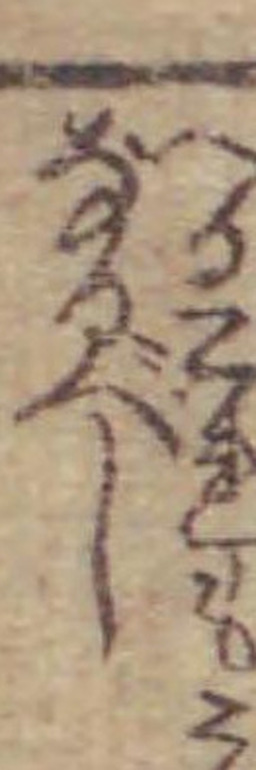なるべし

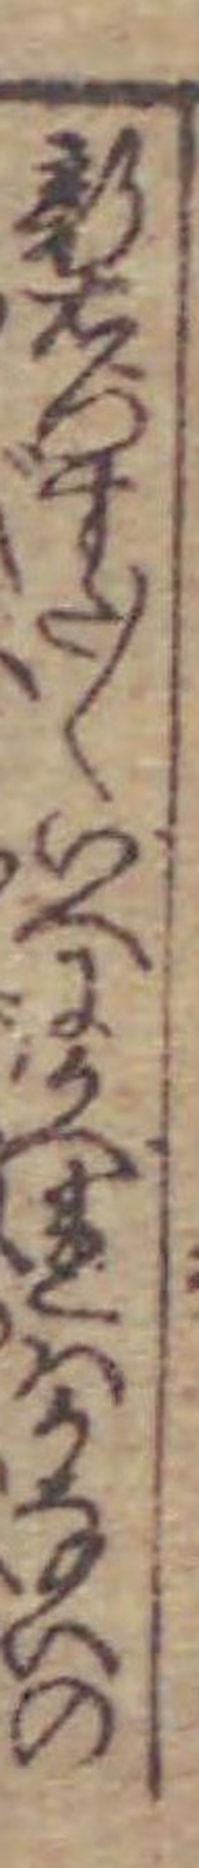新右衛門すた〳〵いへにかへれはかないの
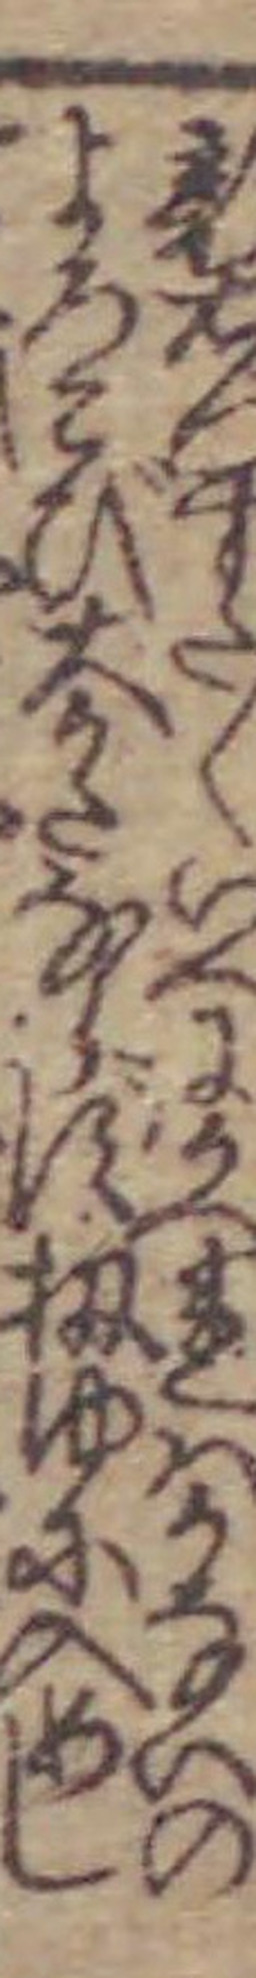よろこび大かたならず扨ゆふ入めし
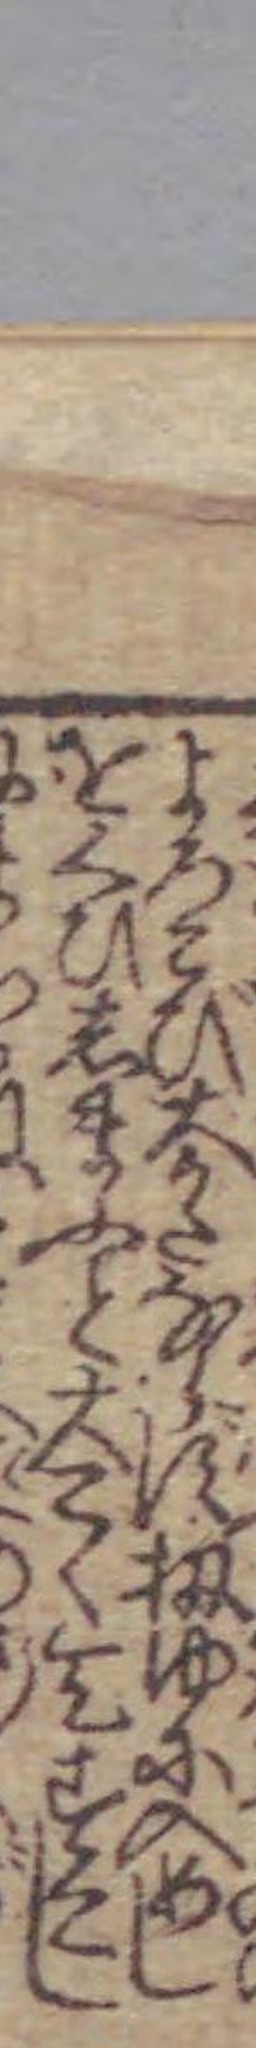をくひしまふと大こく天すこし
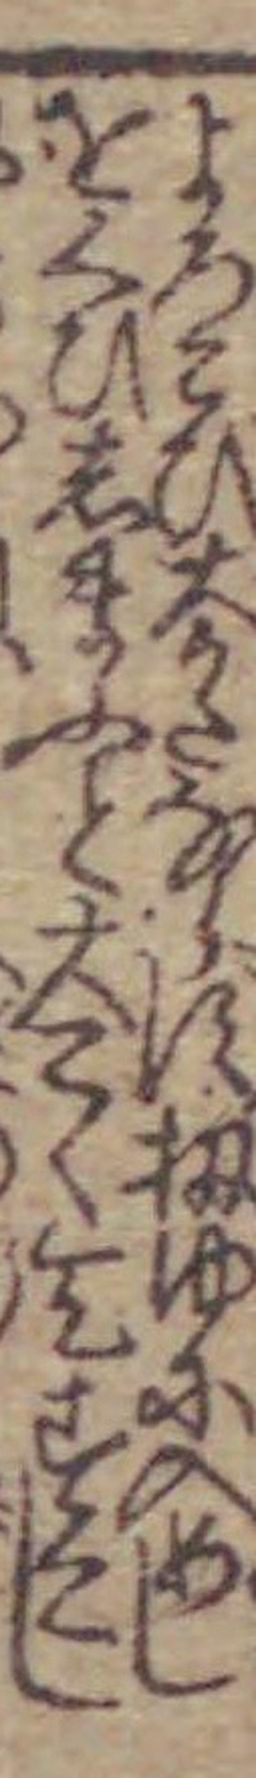をくひしまふと大こく天すこし
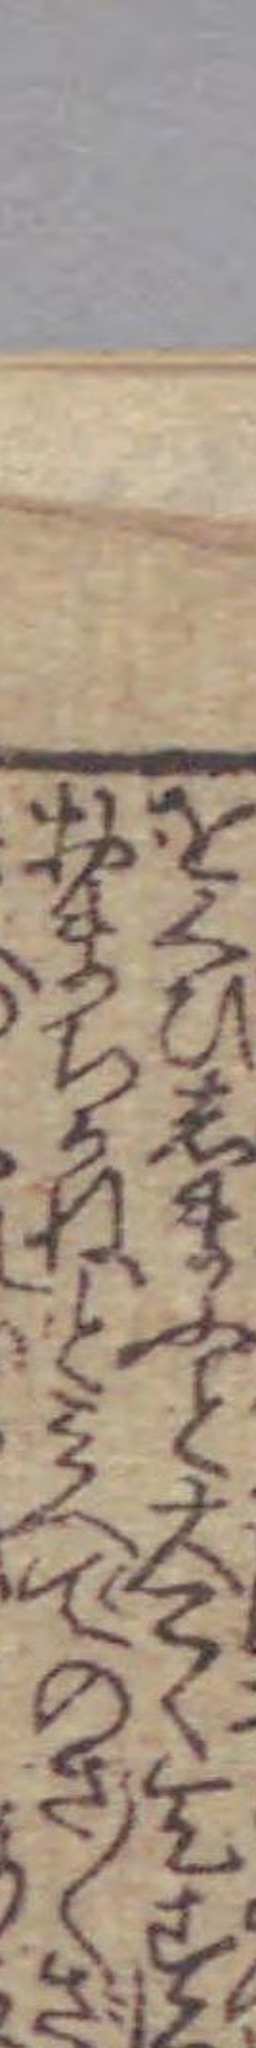おまちかねとみへてのさ〳〵ざし
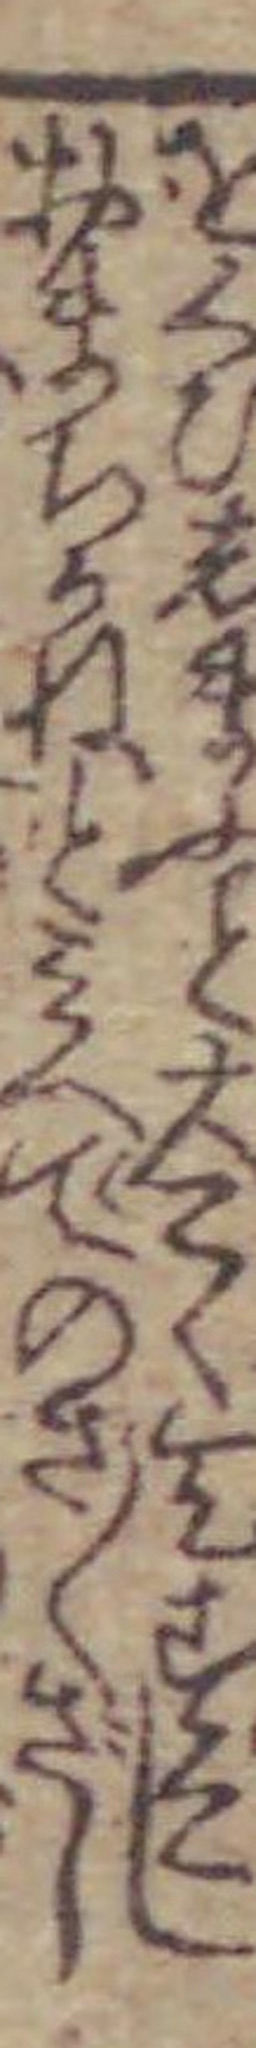おまちかねとみへてのさ〳〵ざし
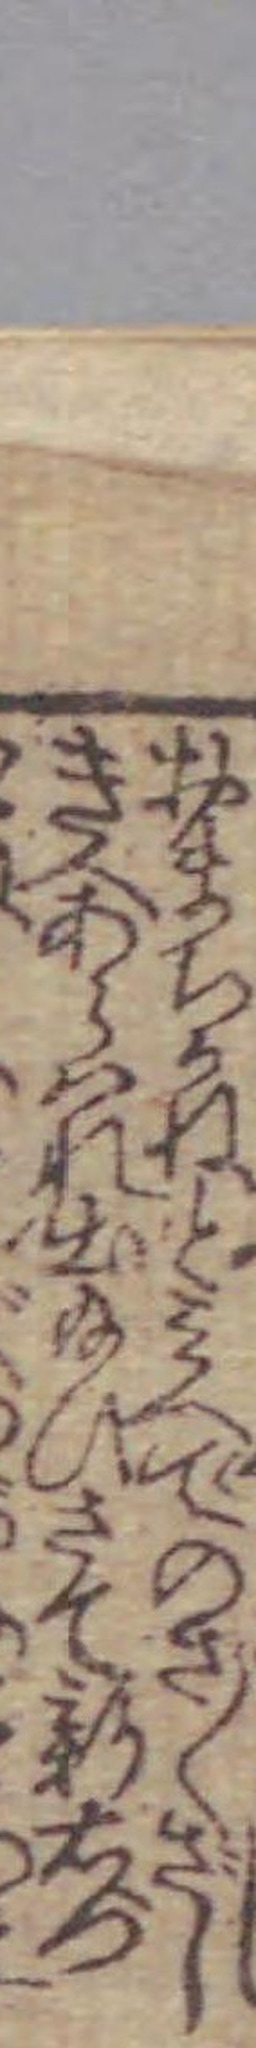きへあらはれ出給ひさて新右衛門
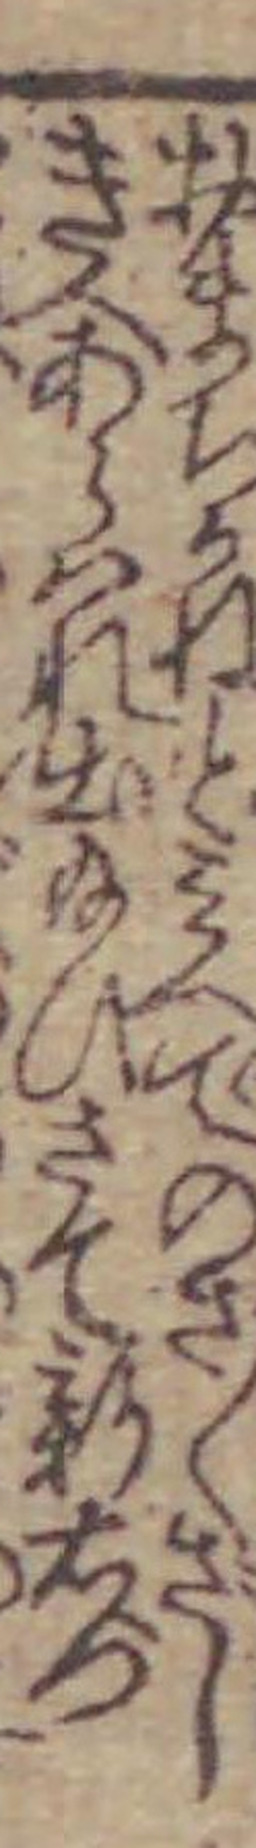きへあらはれ出給ひさて新右衛門
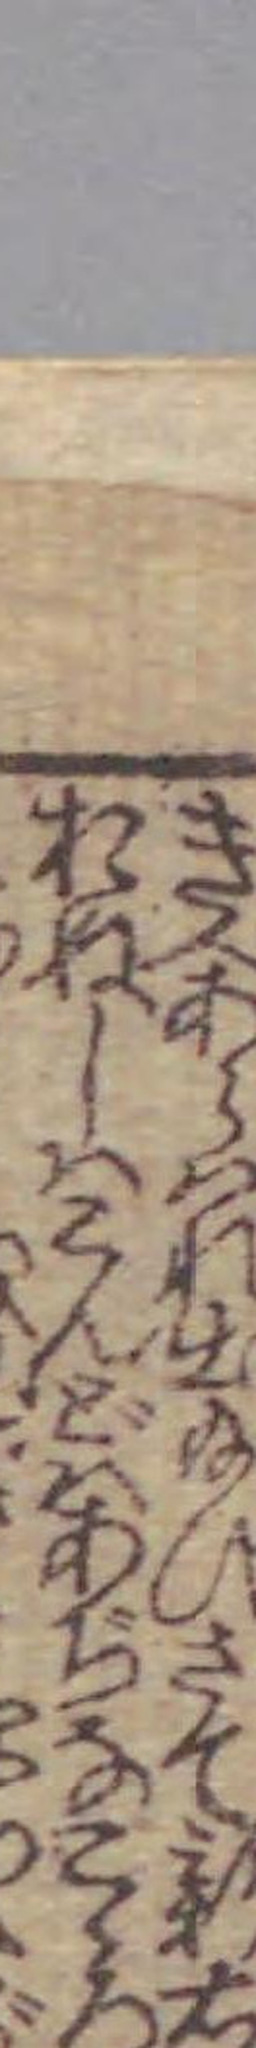おぬしはこんどはあぢなこゝろえ
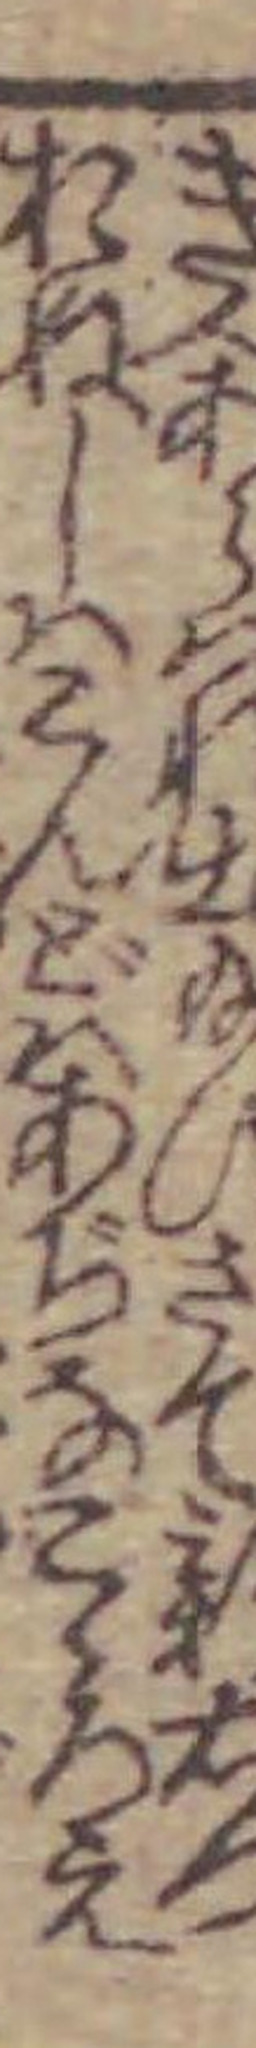おぬしはこんどはあぢなこゝろえ
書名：即席耳学問 : 3巻
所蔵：国立国会図書館 National Diet Library, JAPAN
